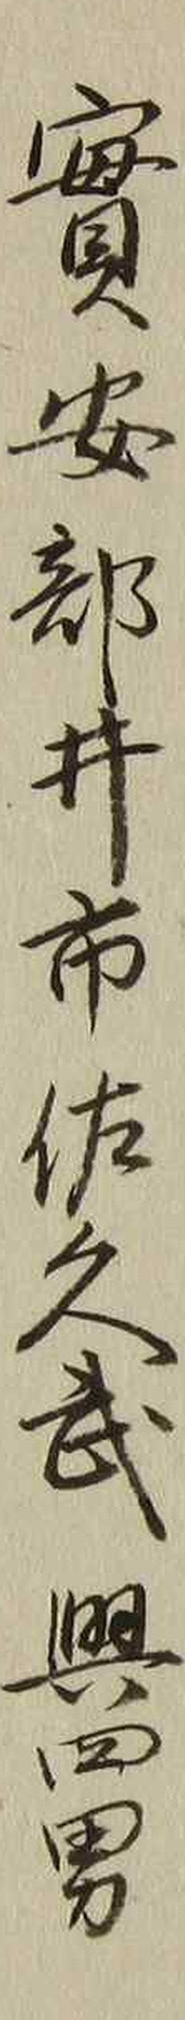実安部井市佐久武興四男
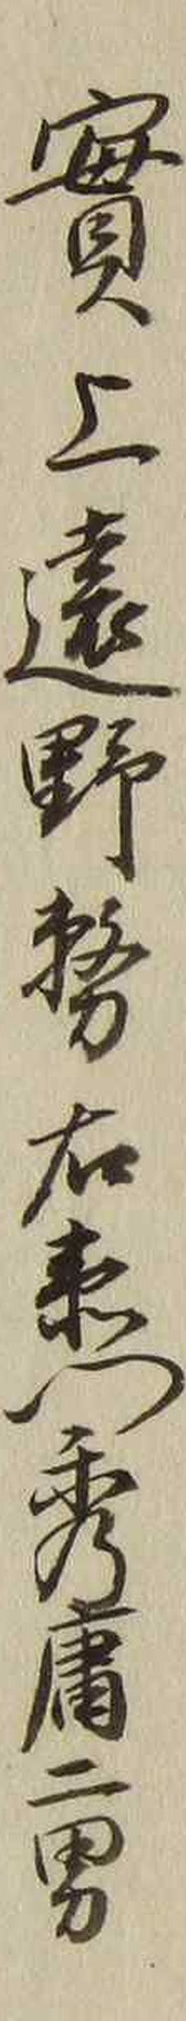実上遠野務右衛門秀庸二男

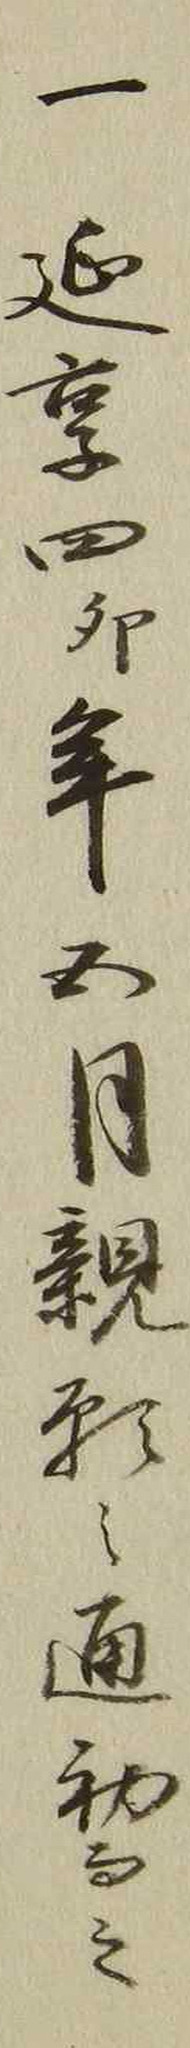一延享四卯年五月親願之通初而之
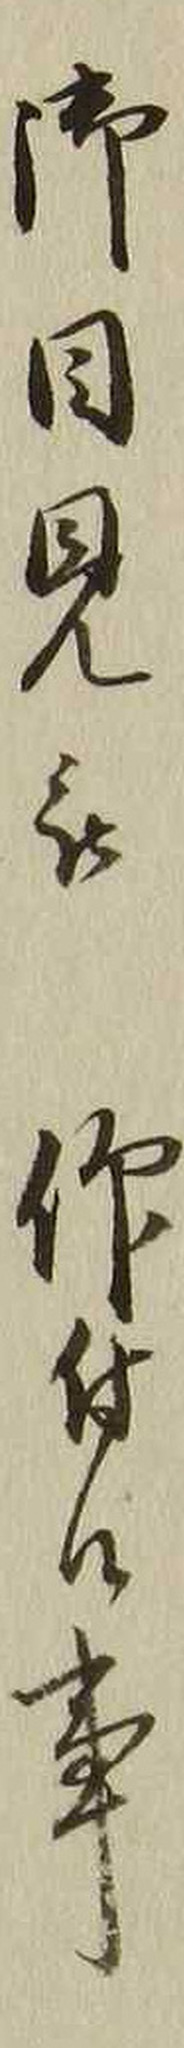御目見被仰付候事
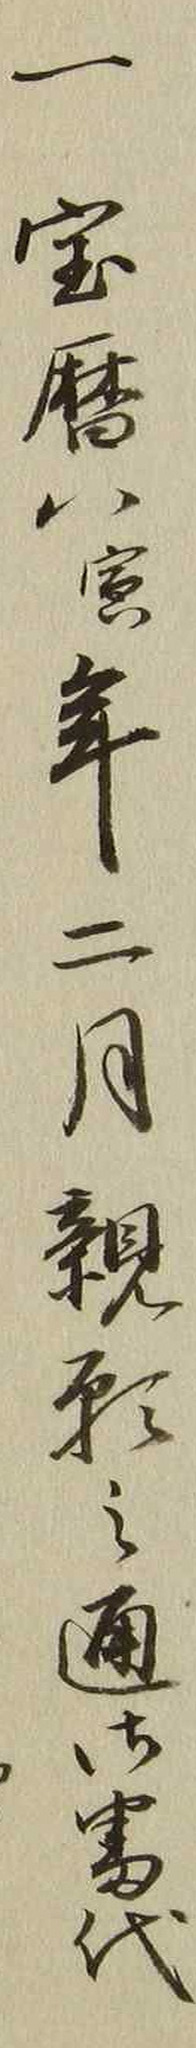一宝暦八寅年二月親願之通御番代
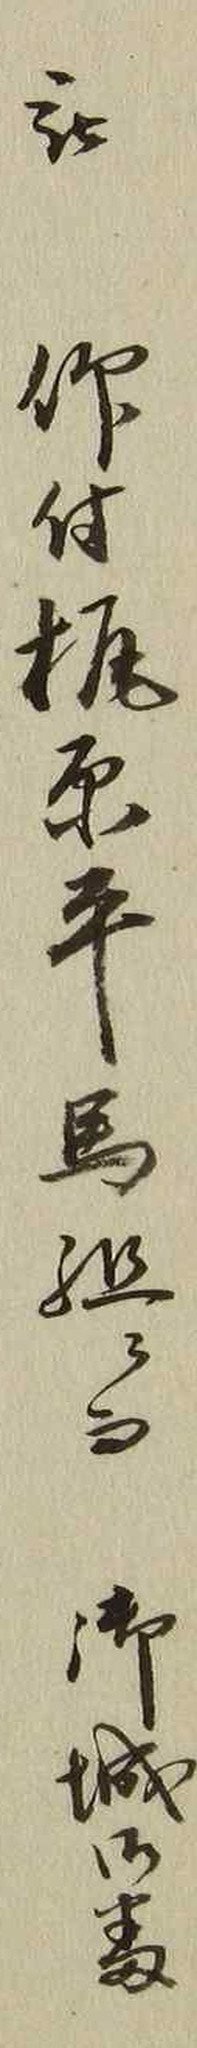被仰付梶原平馬組ニ而御城御番
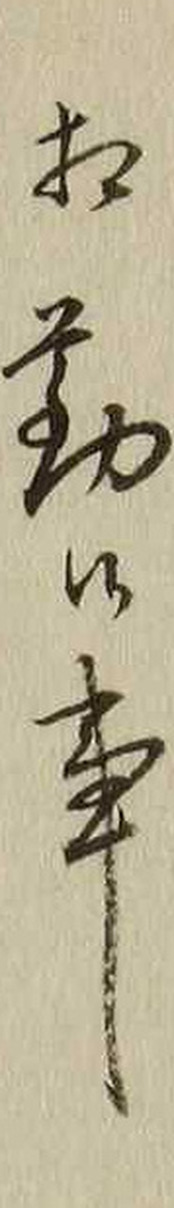相勤候事
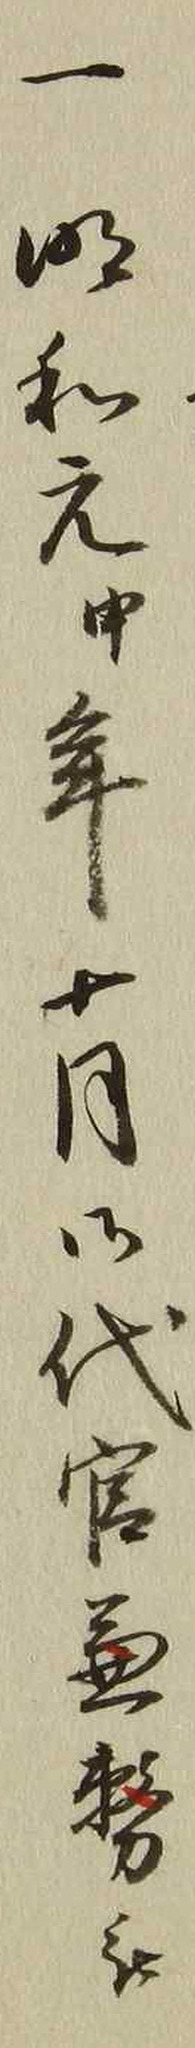一明和元申年十月御代官兼務被
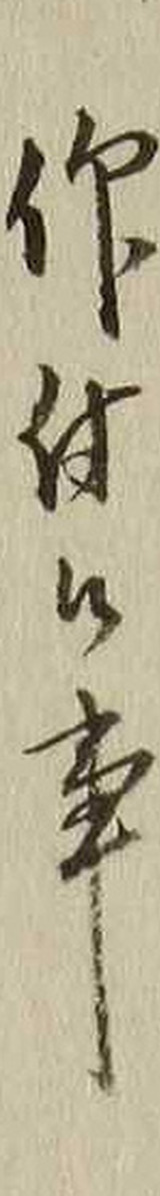仰付候事
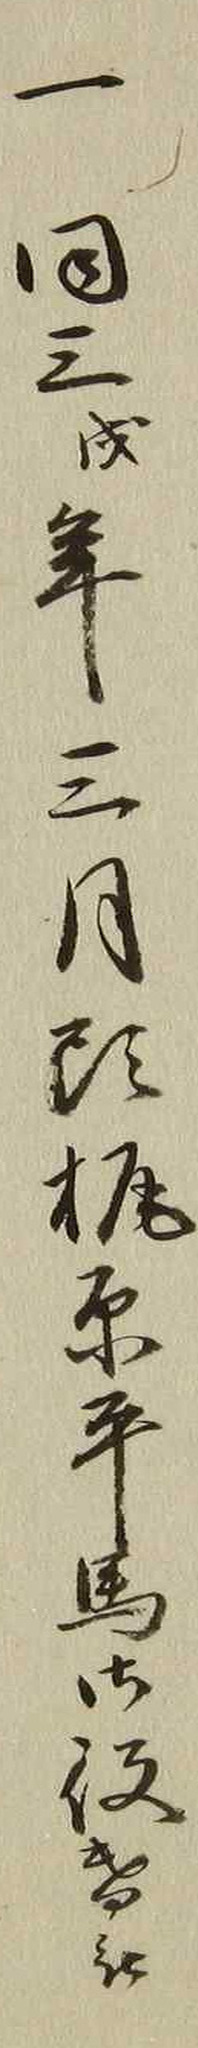一同三戌年三月頭梶原平馬御役替被
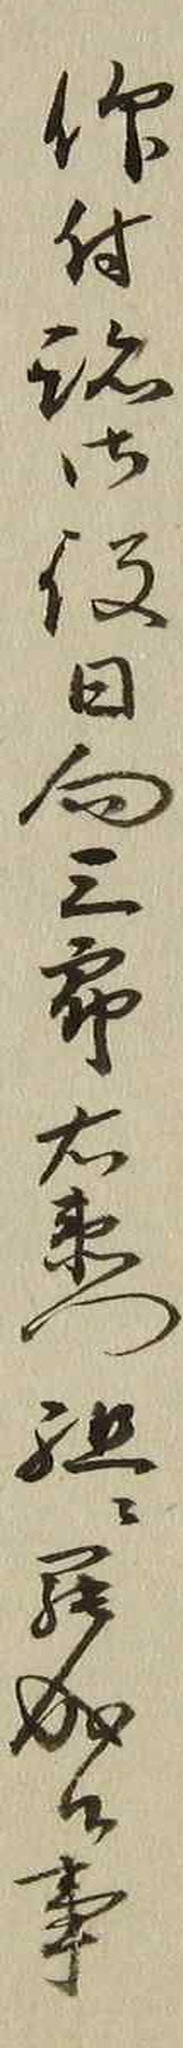仰付跡御役日向三郎右衛門組ニ罷成候事
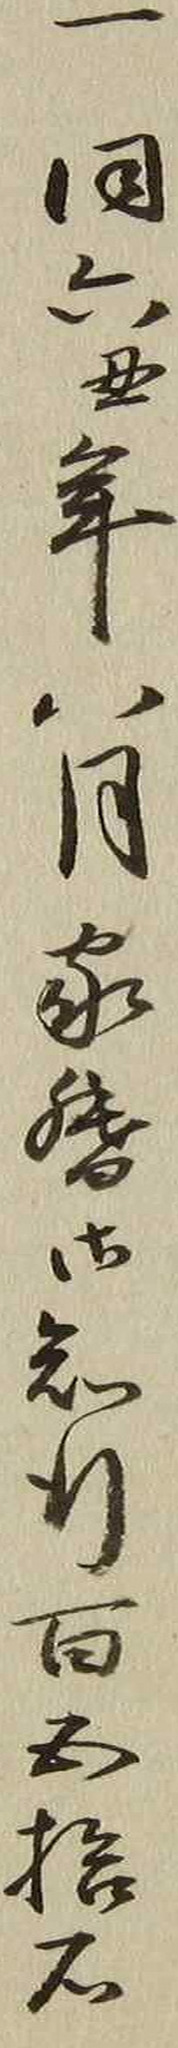一同六丑年八月家替御知行百五拾石
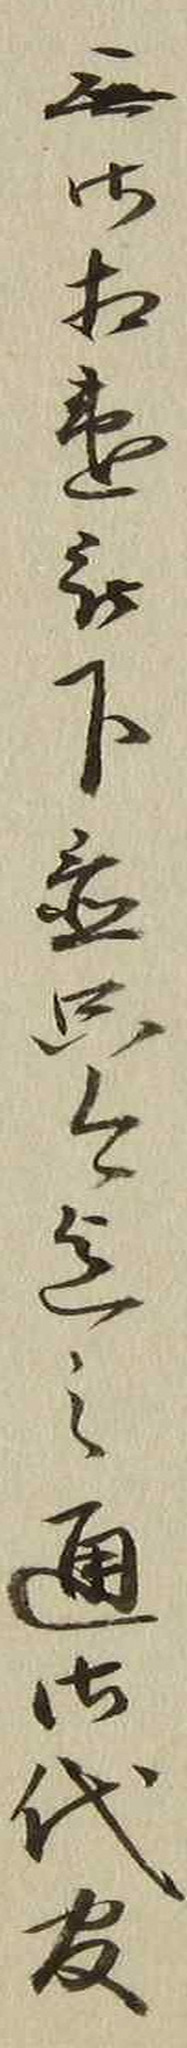無御相遣被下置只今迄之通御代官
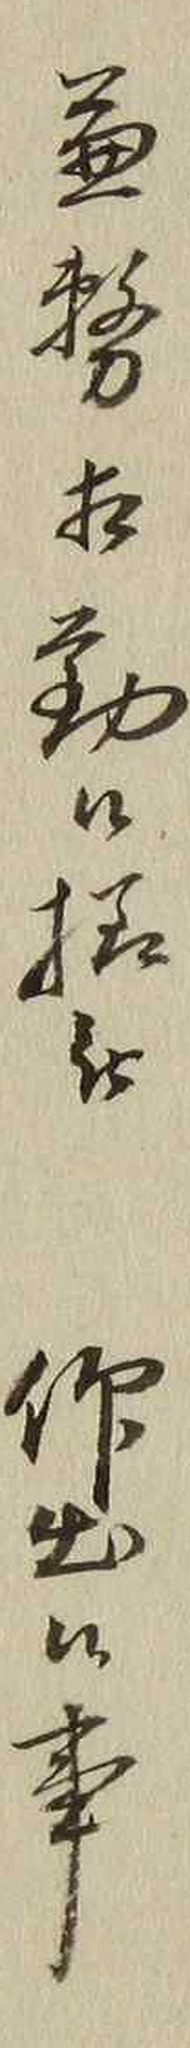兼務相勤候様被仰出候事
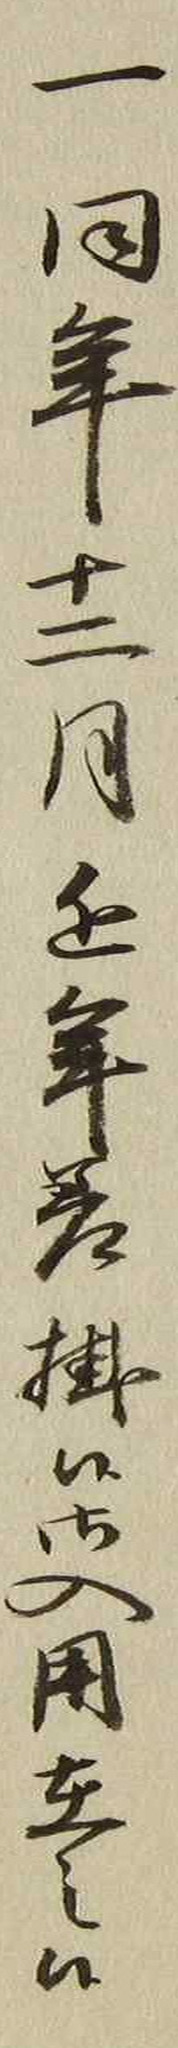一同年十二月近年差掛候御入用在之候
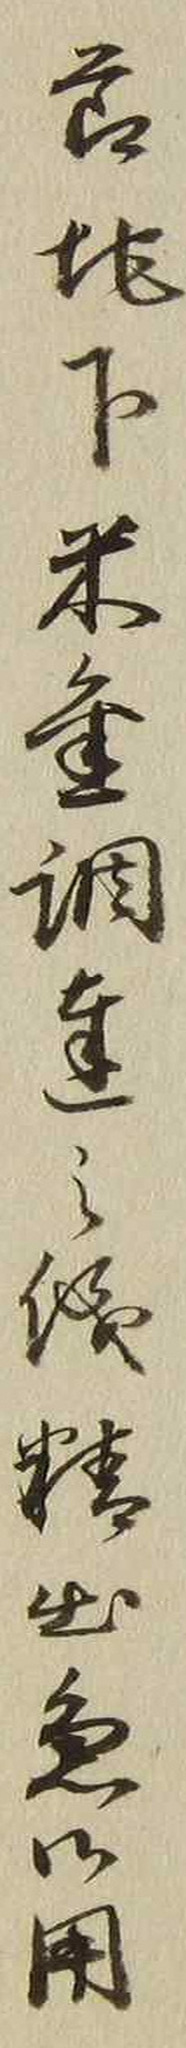節地下米金調達之儀精出急御用
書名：諸士系譜　巻之128　た之部4
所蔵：会津若松市立会津図書館
